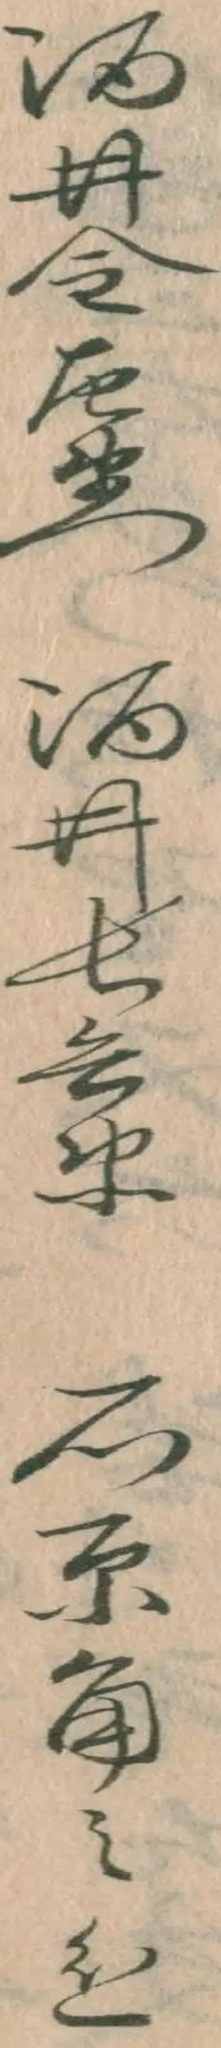酒井金左衛門酒井長兵衛石原角之進
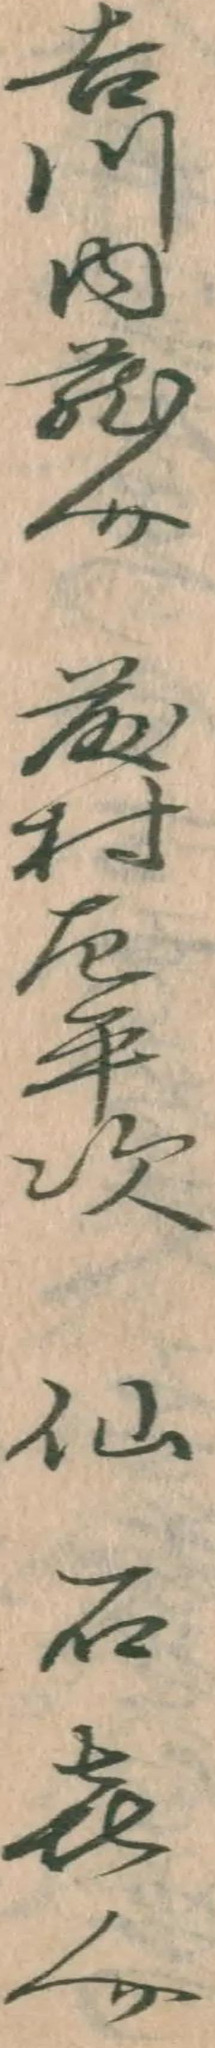吉川内蔵介藤村左平次仙石喜介
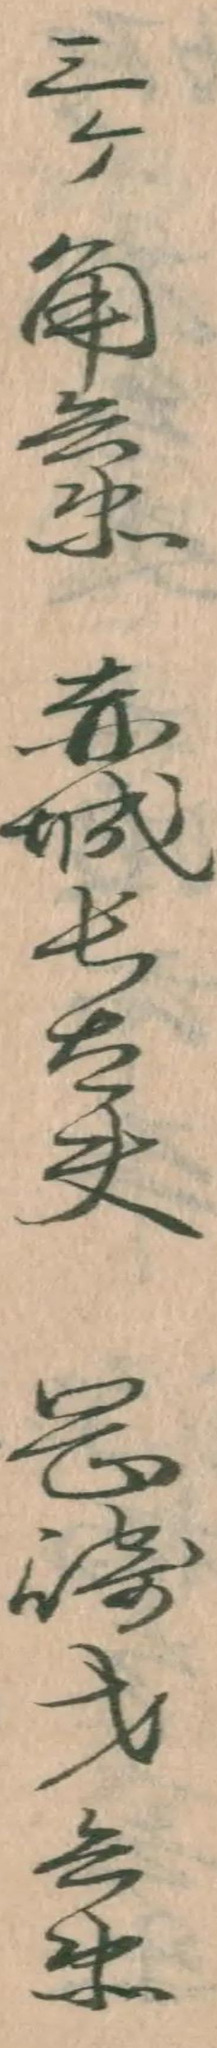三け角兵衛赤城長太夫岡崎才兵衛
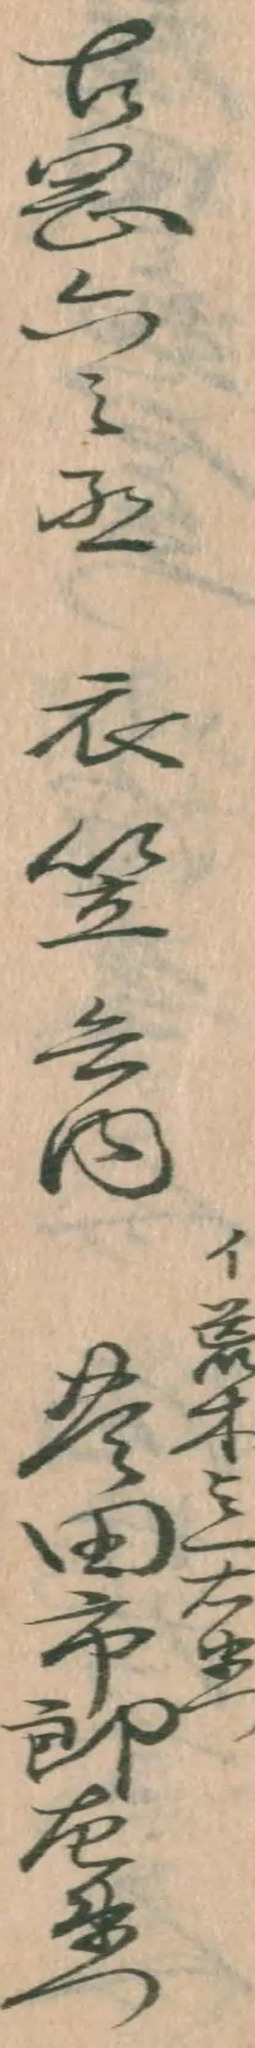古岡六之丞衣笠兵内豊田市郎左衛門
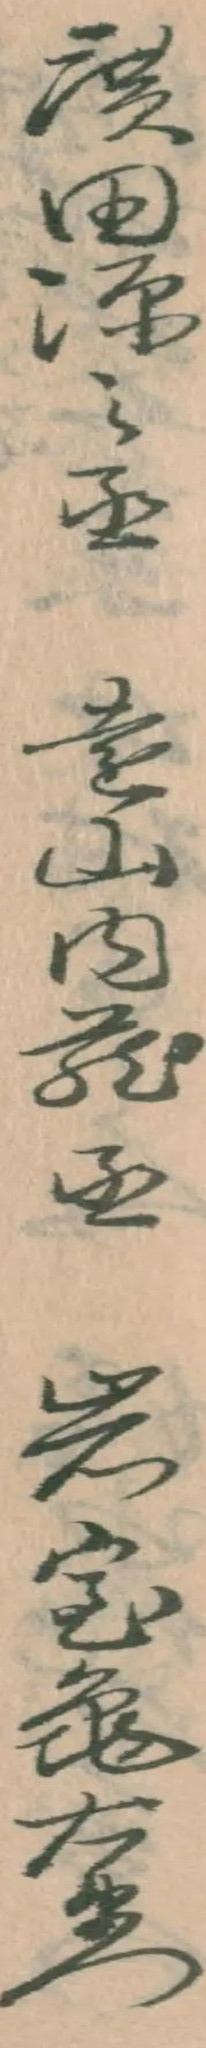廣田源之丞遠山内蔵丞岩宝亀右衛門
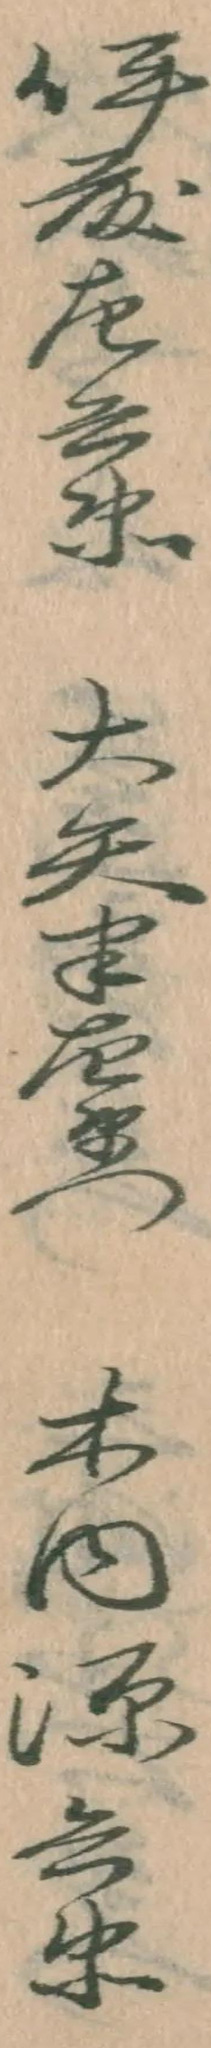伊藤左兵衛大矢半左衛門木内源兵衛
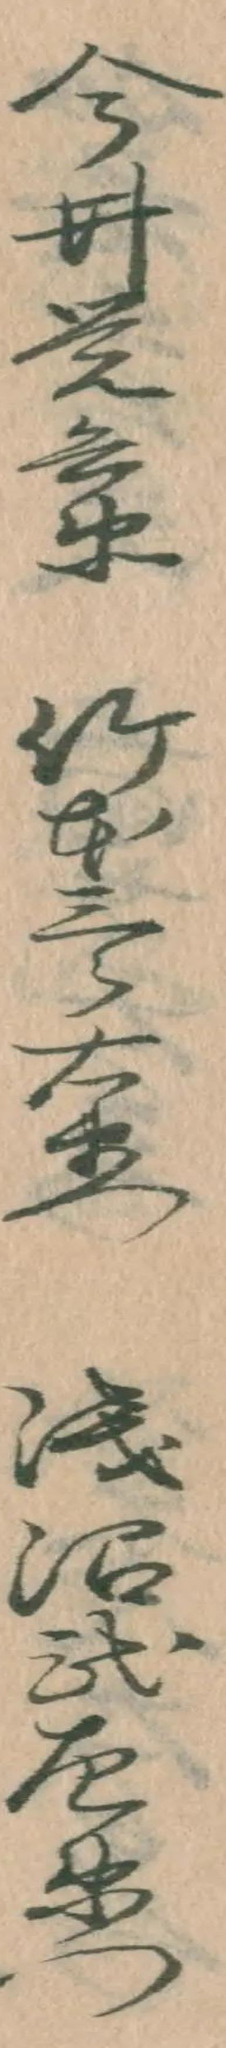今井覚兵衛竹本三郎右衛門浅沼武左衛門
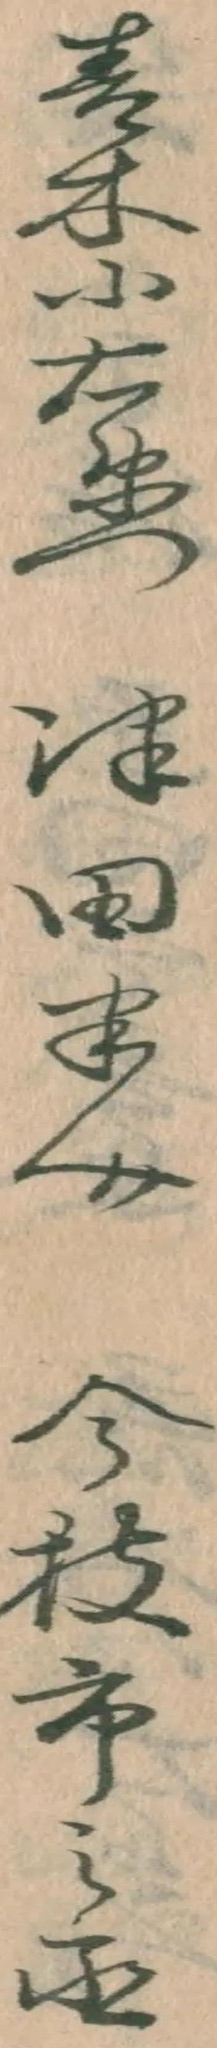青木小右衛門津田半介今枝市之丞
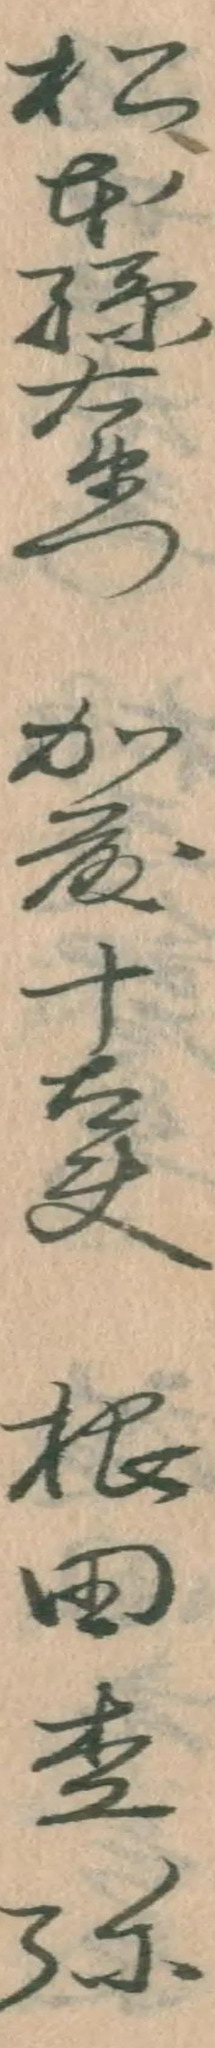松本孫右衛門加藤十太夫根田杢弥
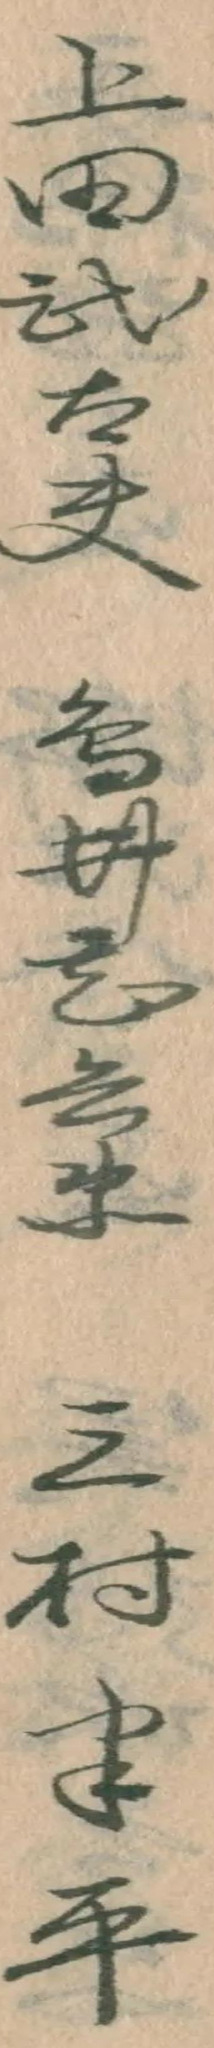上田武太夫鳥井甚兵衛三村半平
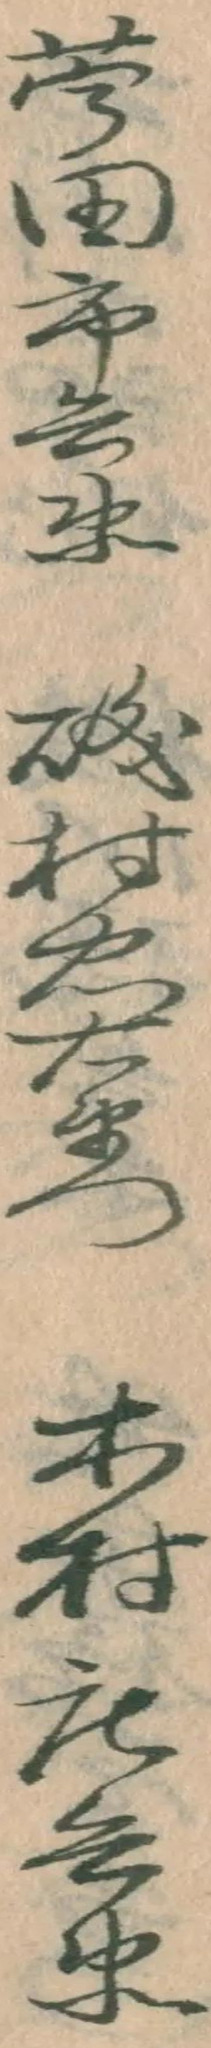苧田市兵衛磯村忠右衛門木村庄兵衛
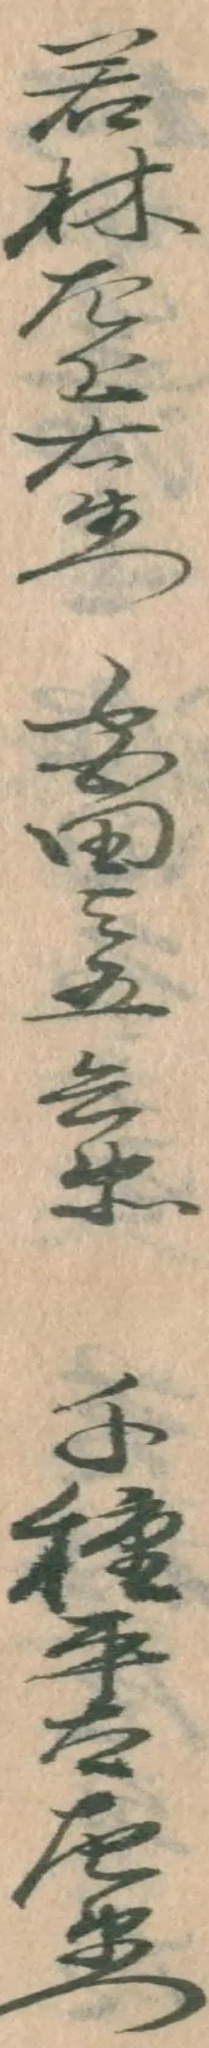若林左近右衛門宮田与五兵衛千種平太左衛門
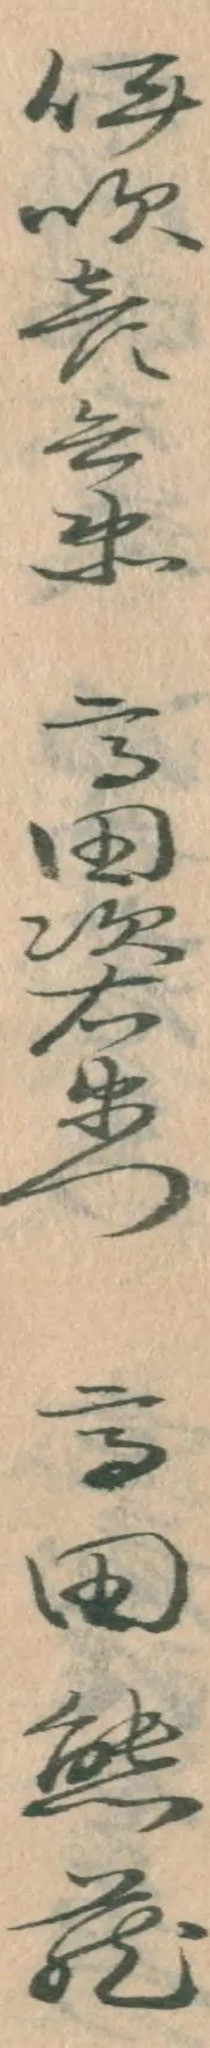伊吹彦兵衛高田次右衛門高田熊蔵
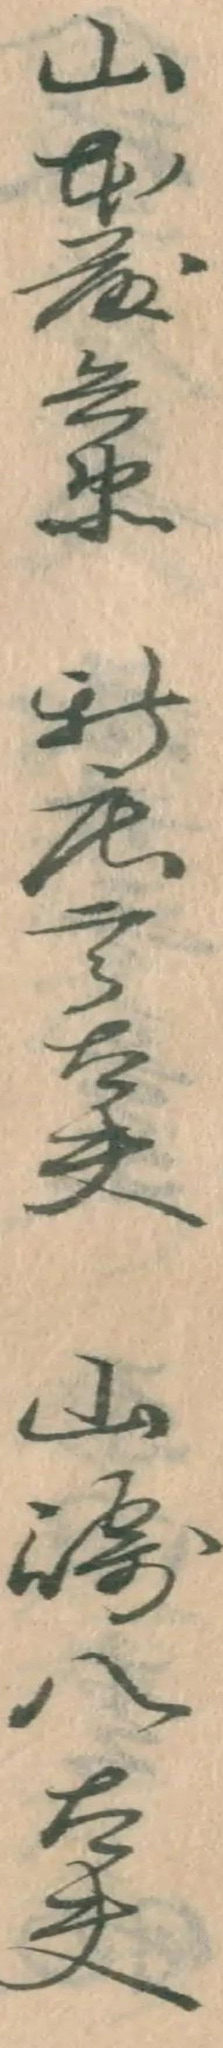山本藤兵衛新庄二郎太夫山崎八

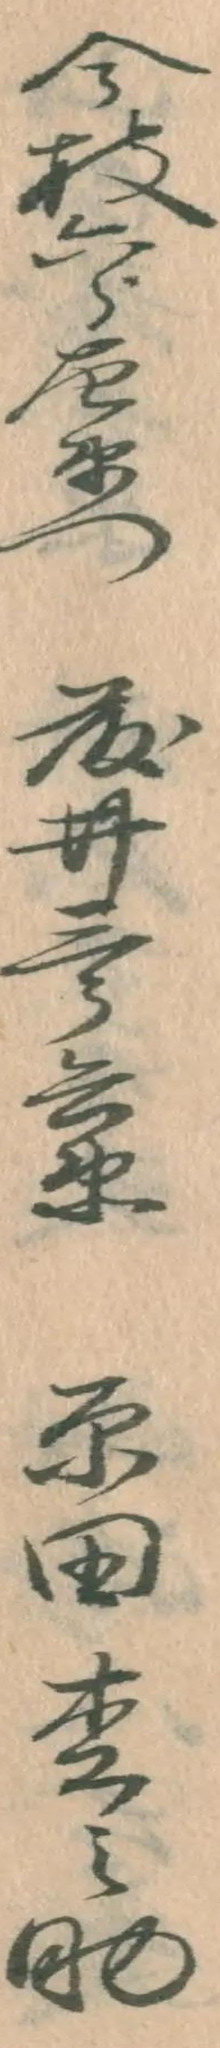今枝六郎左衛門藤井三郎兵衛原田杢之助
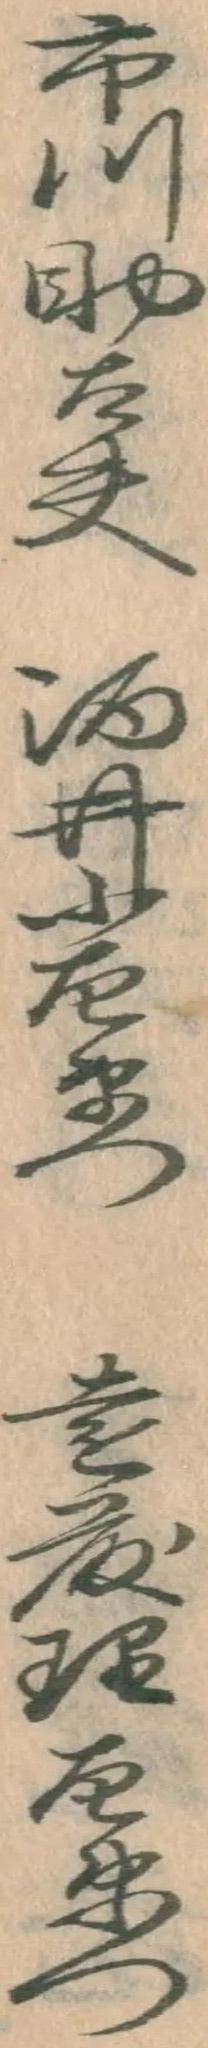市川助太夫酒井小左衛門遠藤理左衛門
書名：切支丹御退治記 49巻. [9]
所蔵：国立国会図書館 National Diet Library, JAPAN
